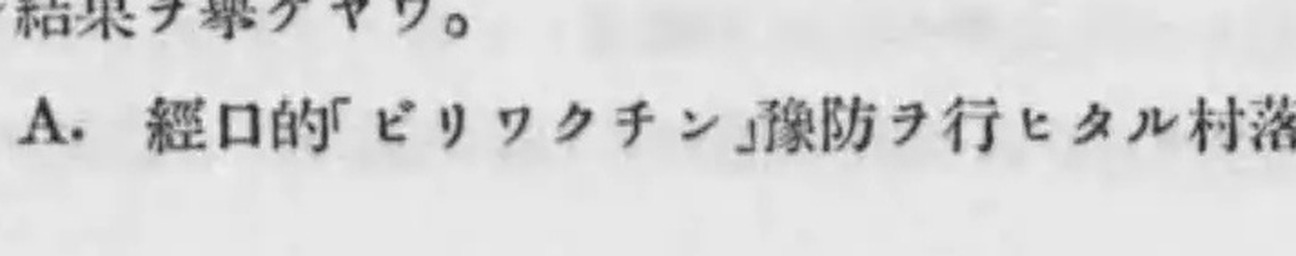,経口的「ビリワクチン」予防を行ひたる村落:

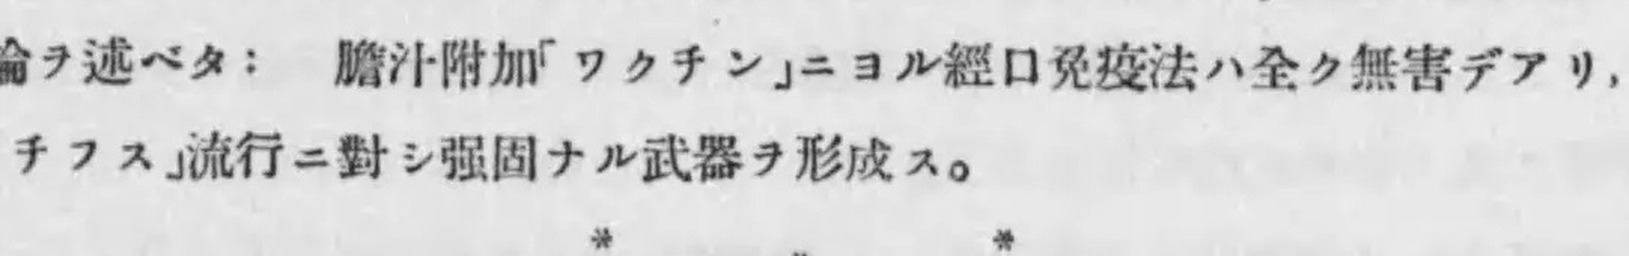腸「チフス」流行に対し強固なる武器を形成す。
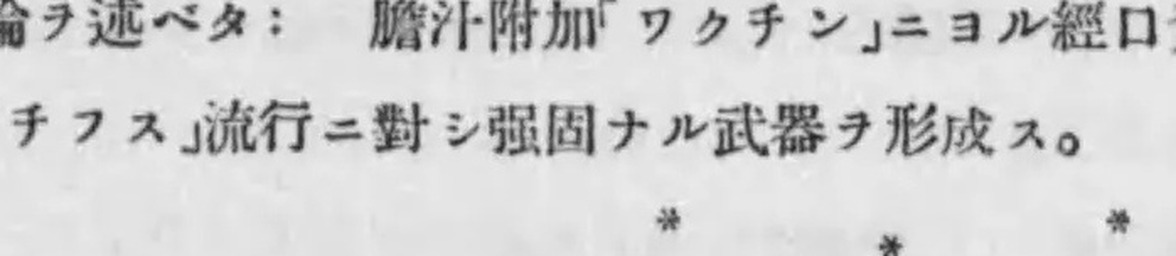腸「チフス」流行に対し強固なる武器を形成す。
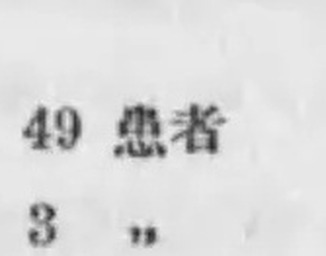,患者
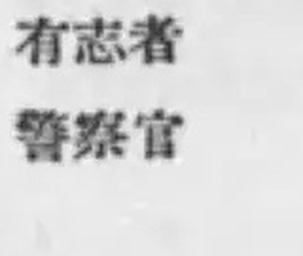警察官〃

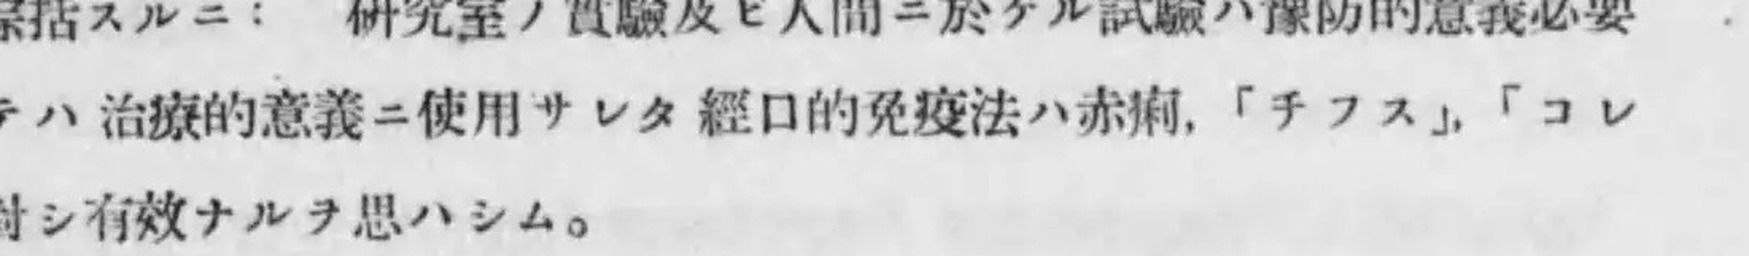によつては治療的意義に使用された経口的免疫法は赤痢、「チフス」、「コレ

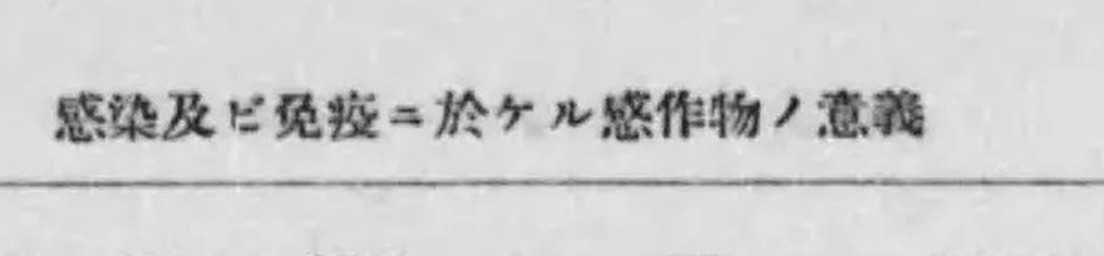感染及び免疫に於ける感作物の意義

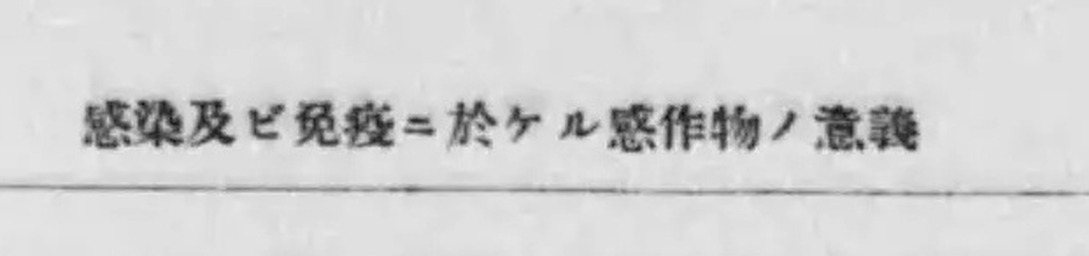感染及び免疫に於ける感作物の意義

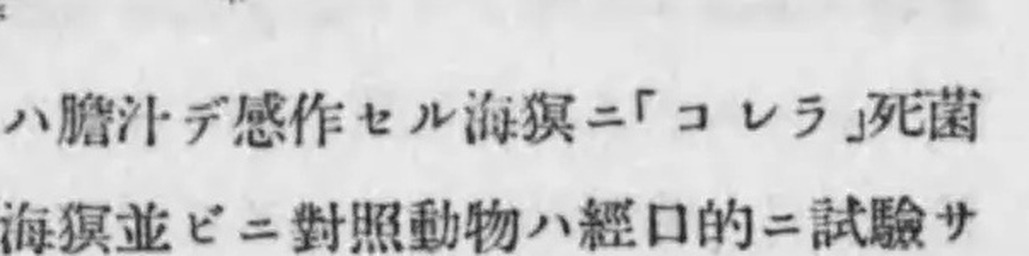-は胆汁で感作せる海猽に「コレラ」死菌

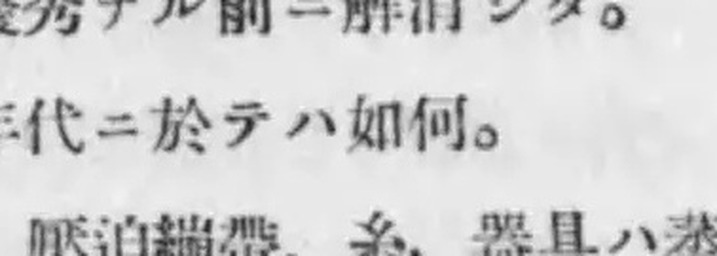-年代に於ては如何。
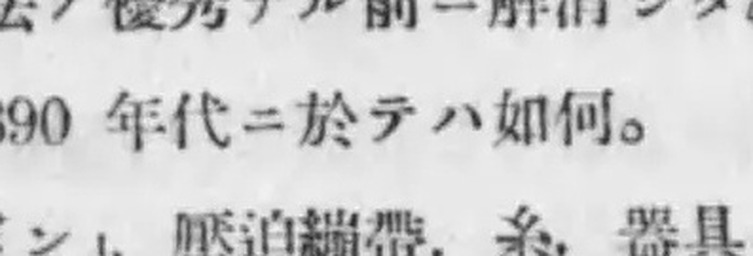-年代に於ては如何。

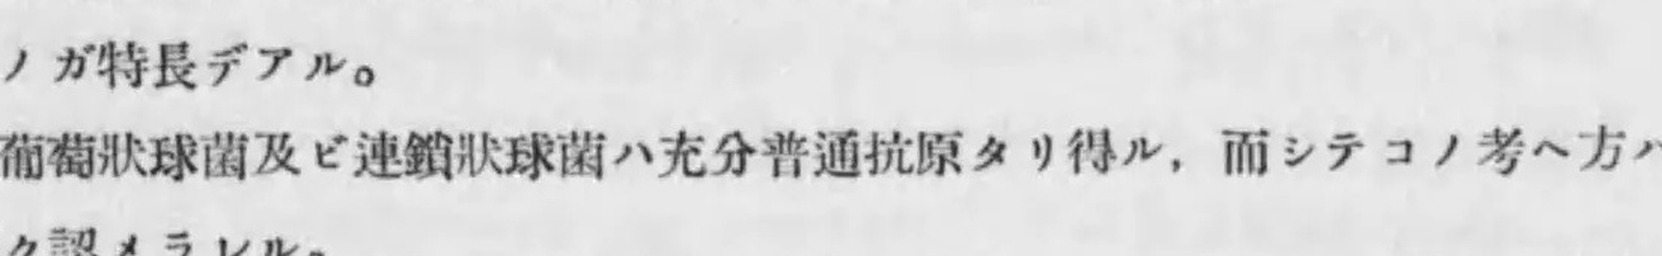葡萄状球菌及び連鎖状球菌は充分普通抗原たり得る、而してこの考へ方は

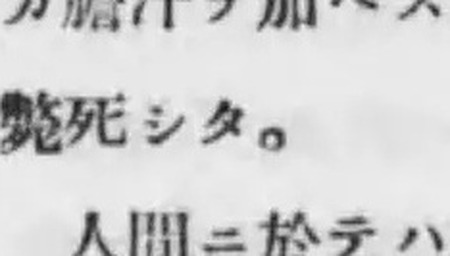斃死した。

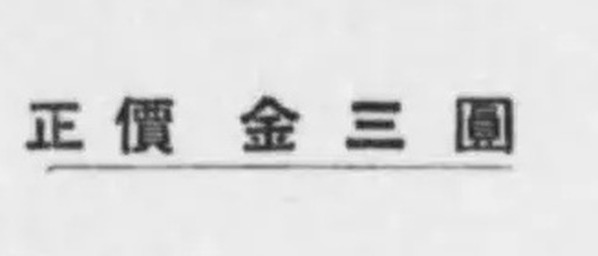正価金三円
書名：伝染病ニ於ケル免疫ニ関スル研究
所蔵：国立国会図書館 National Diet Library, JAPAN
